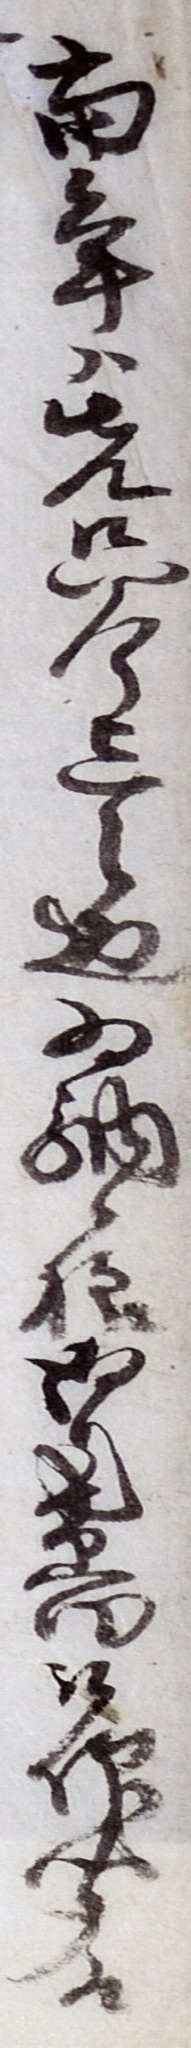当年ハ先只今迄之通為納候様御用番被仰聞候
